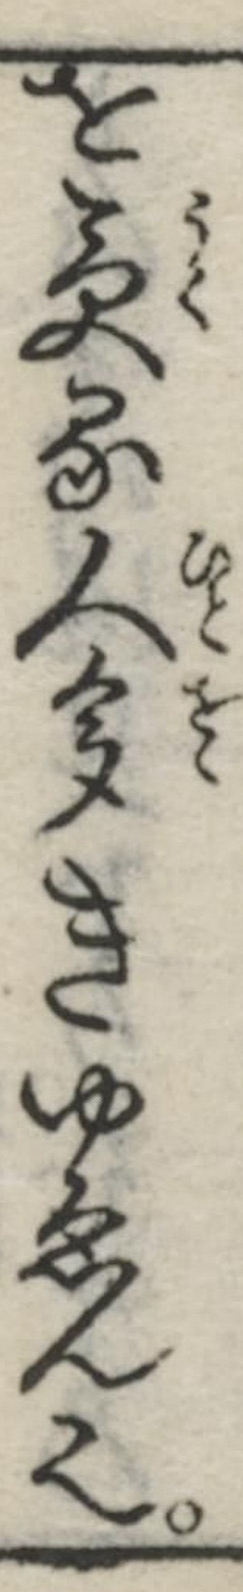を受る人多きゆゑん也。
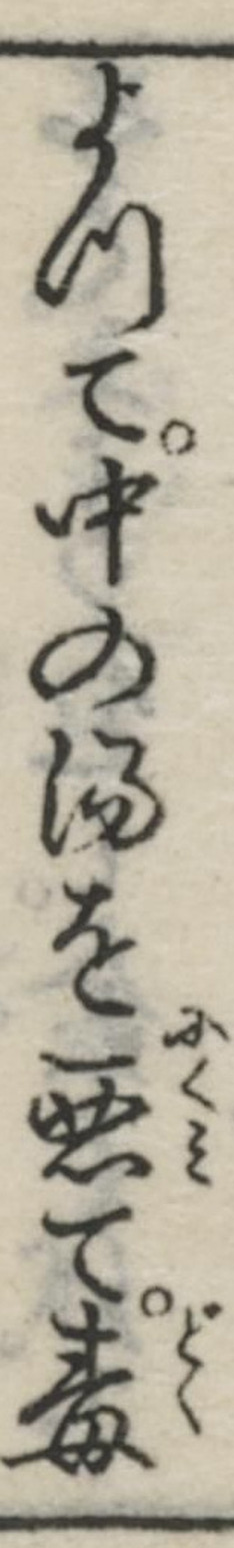よつて。中の湯を悪て。毒
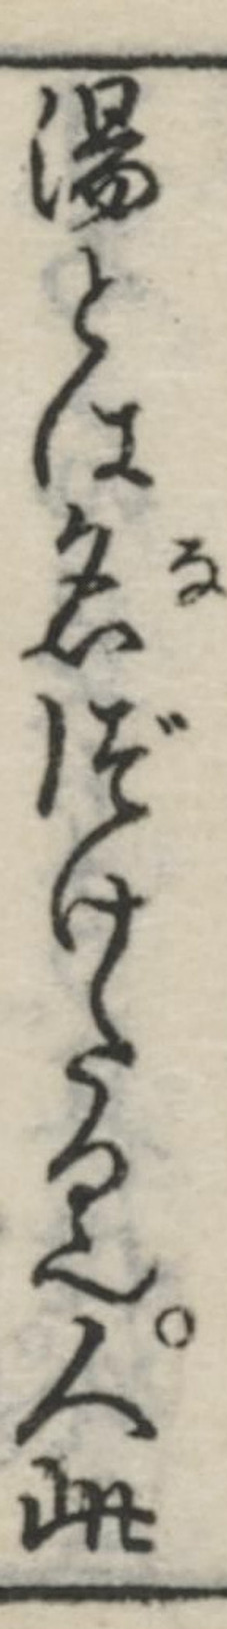湯とは名づけたる也。人此
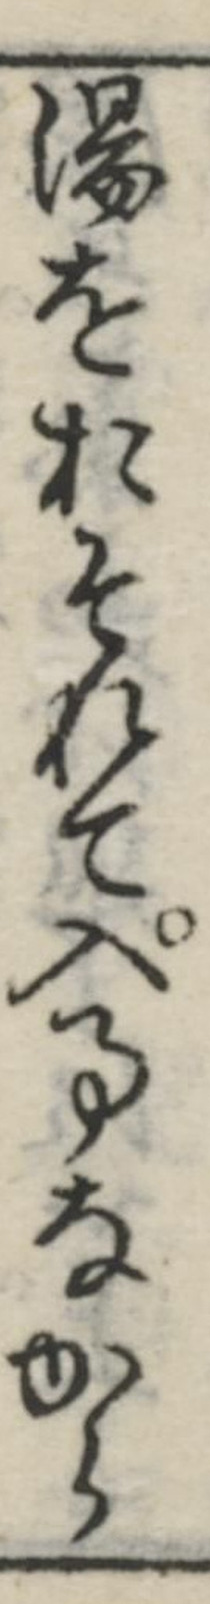湯をおそれて。入事なから
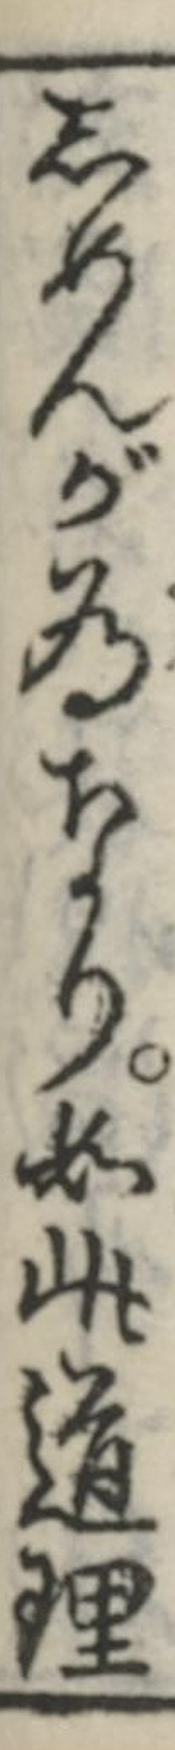しめんが為なり。如此道理
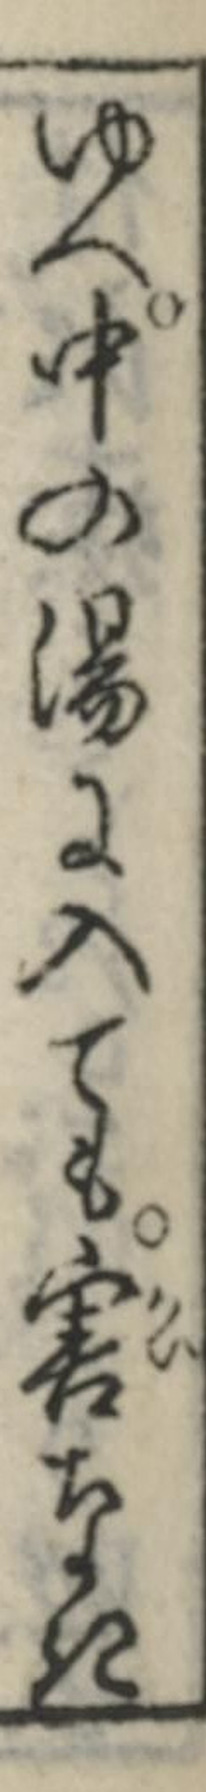ゆへ。中の湯に入りても。害なき
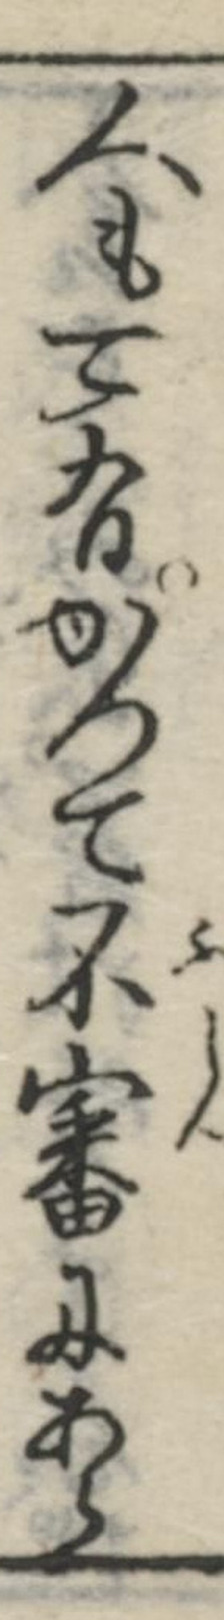人も可有。かつて不審にあら
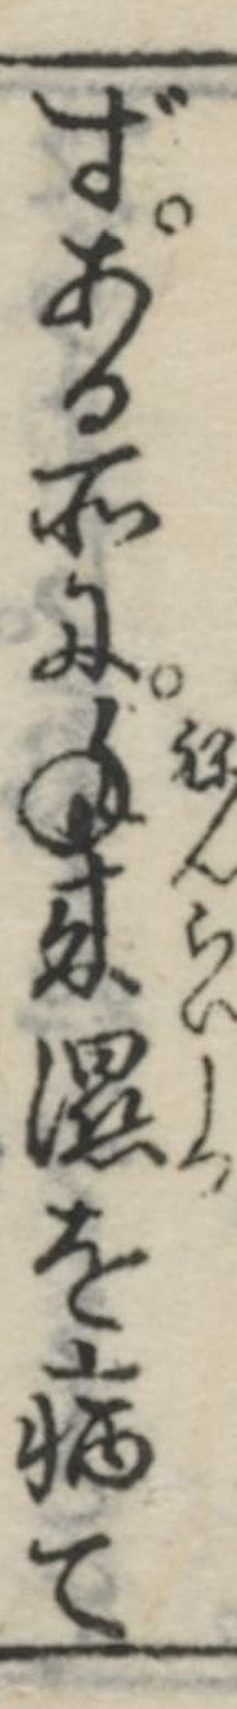ず。ある所に。年来湿を病て
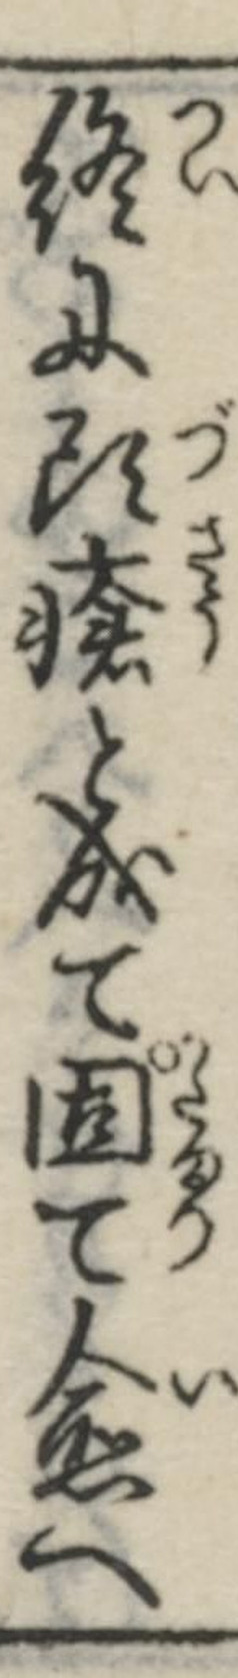終に頭瘡と成て。固て癒へ
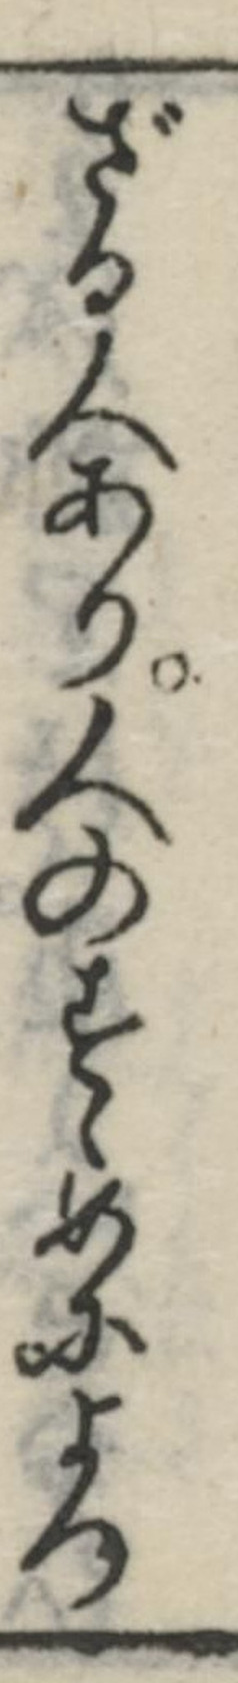ざる人あり。人のすゝめによつ
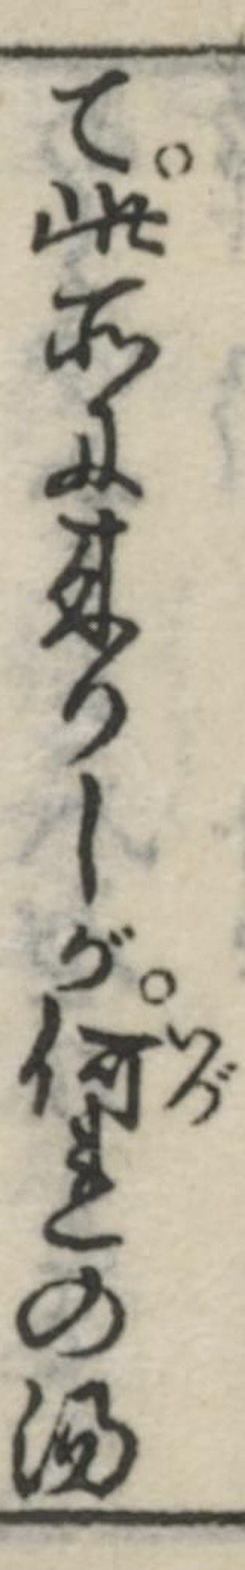て。此所に来たりしが。何れの湯
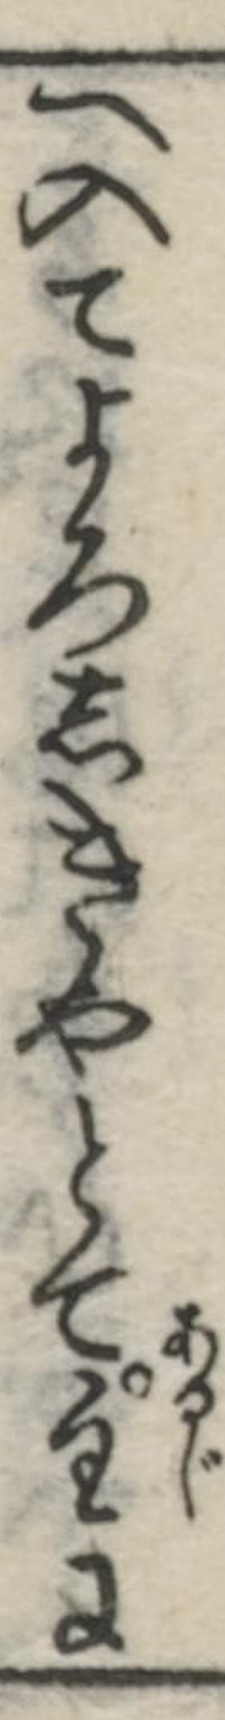へ入りてよろしきやとて。主に
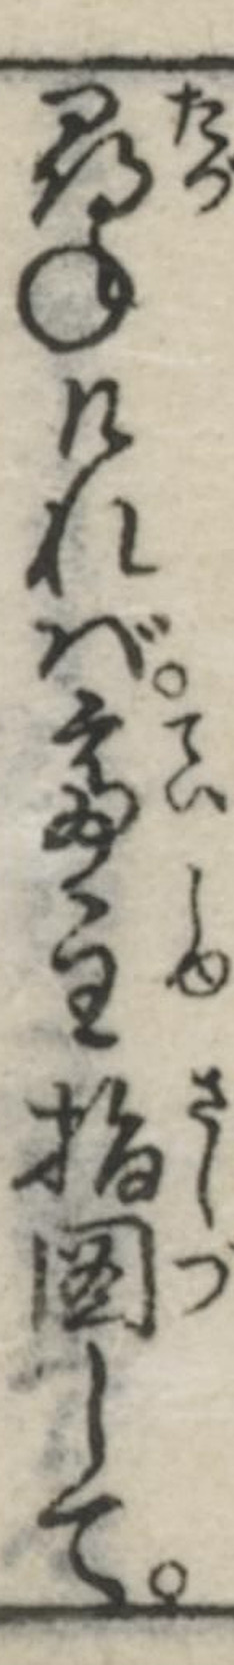尋ねければ。亭主指図して。
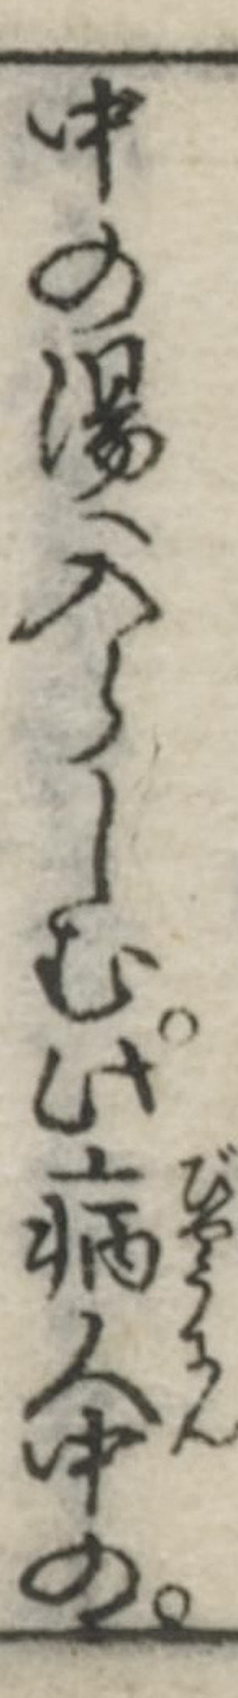中の湯へ入らしむ。此病人中の。
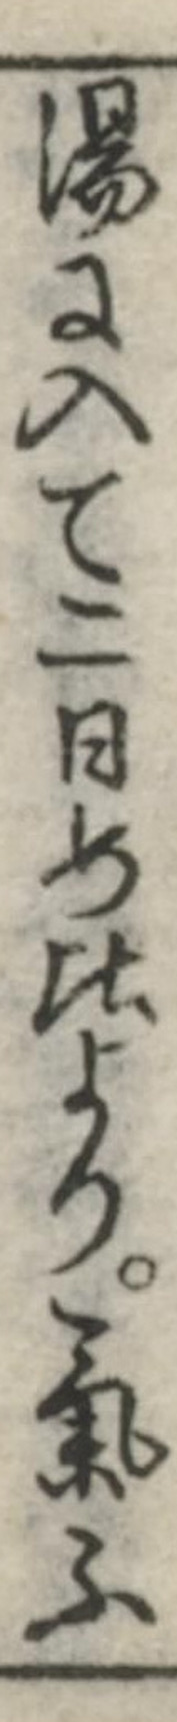湯に入て二日め比より。気ふ
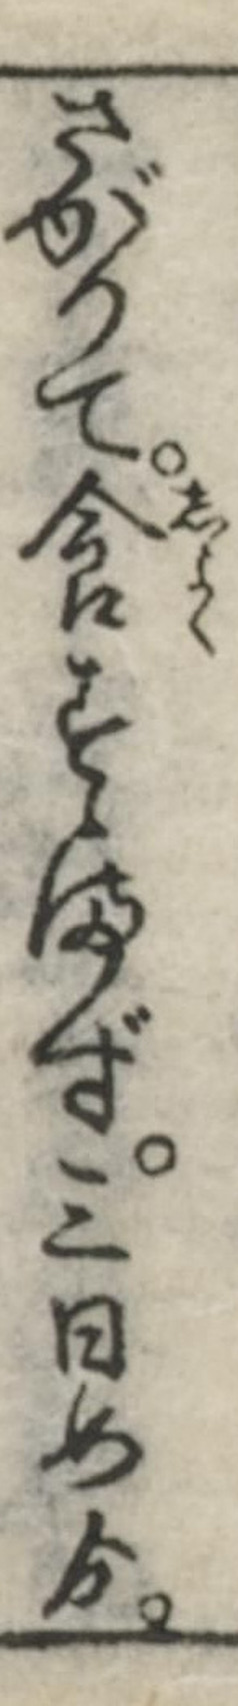さがりて。食すゝまず。三日めゟ。
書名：但州城崎浴湯辧
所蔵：東京大学地震研究所図書室 Earthquake Research Institute Library, The University of Tokyo, JAPAN
